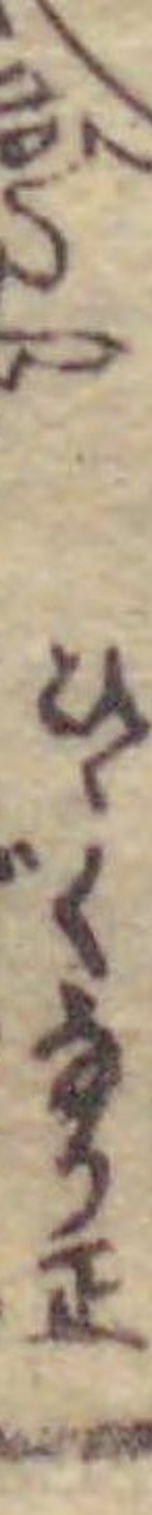ひゝくなり正
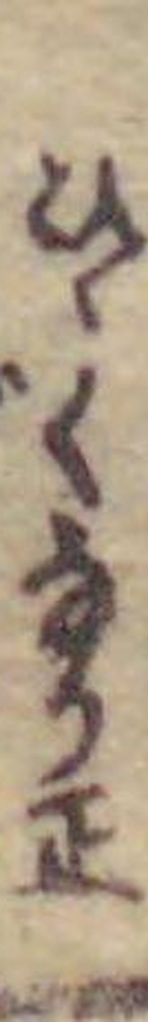ひゝくなり正
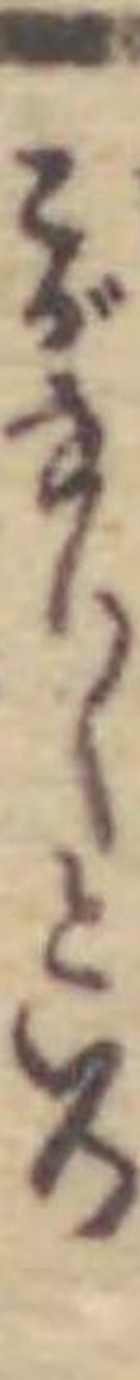こがない〳〵といつ
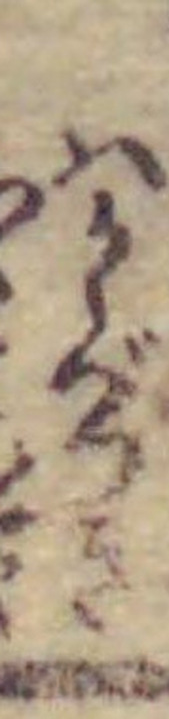はかくべつき
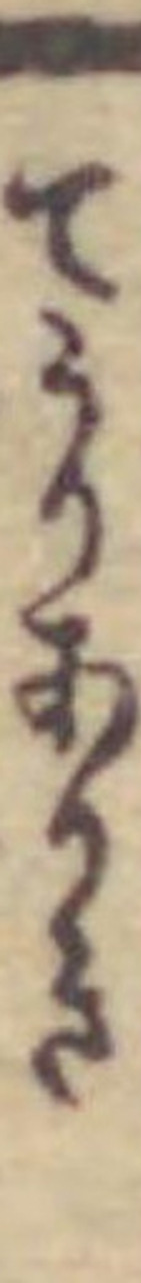てうりありき
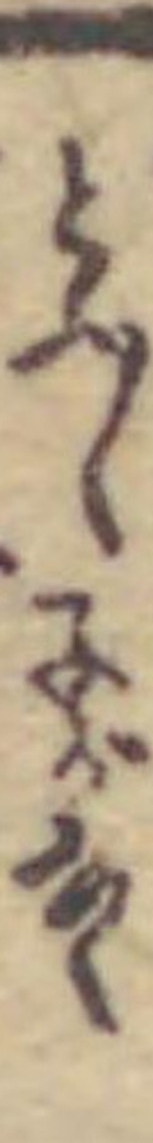とふ〳〵子がなく
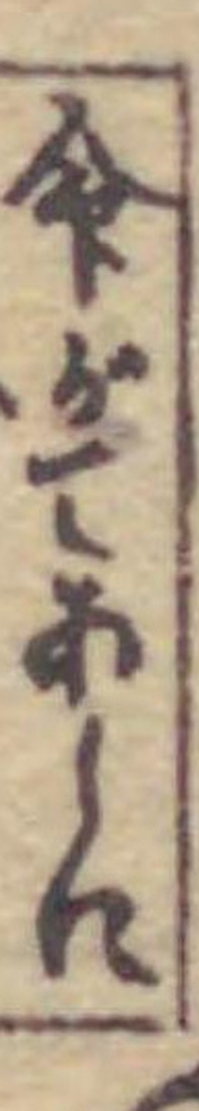命にてあしを
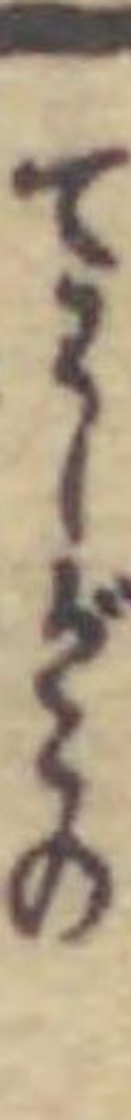てわしがこの
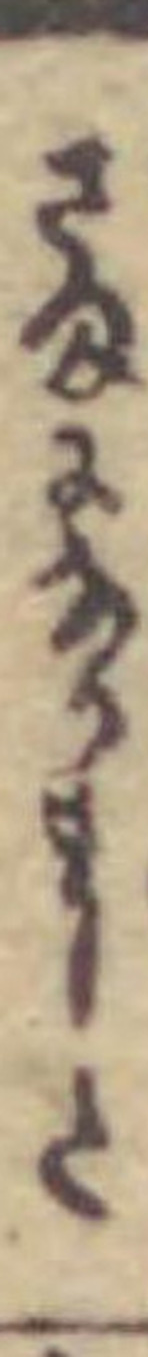さまになりました
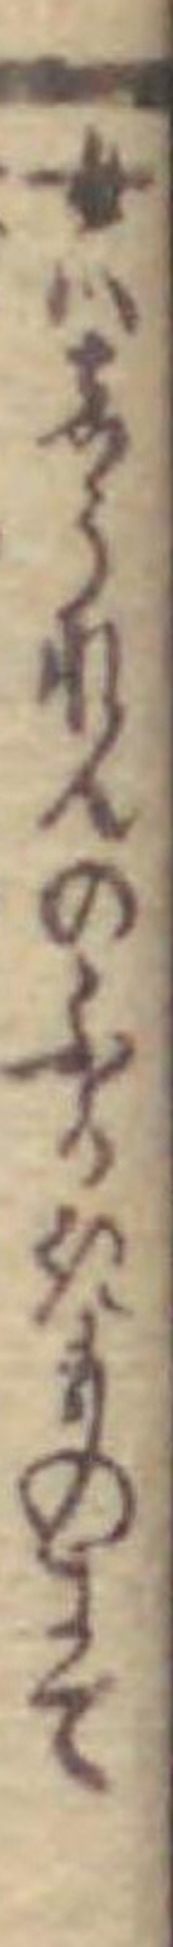女はしうねんのふかきものにて
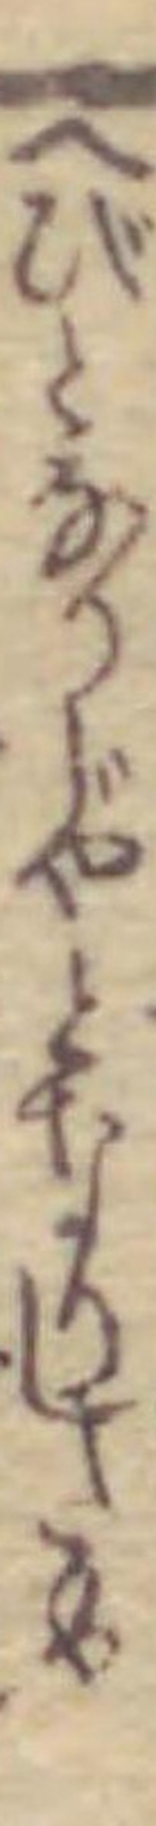へびとなりじやとなりしたりや
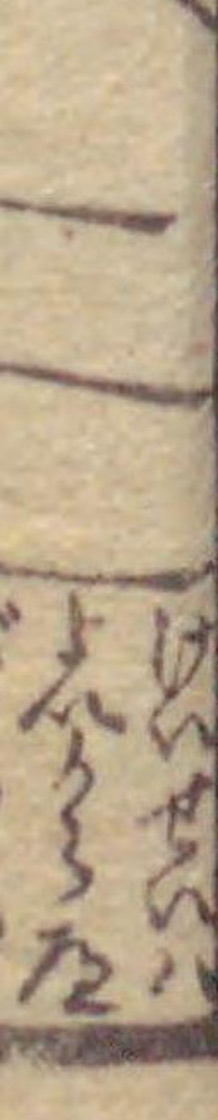よいから道
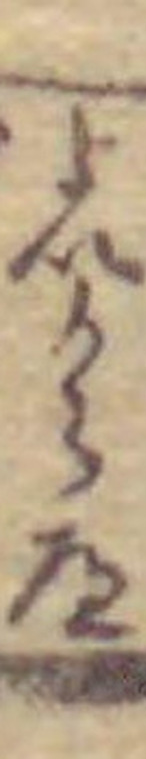よいから道
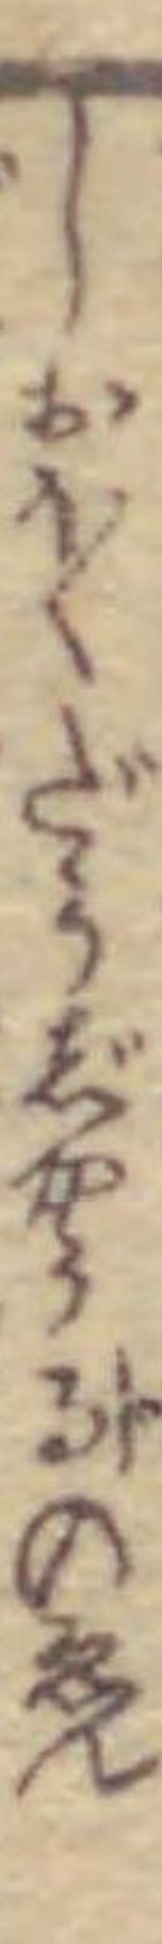しおほくだうじやう外のゑん
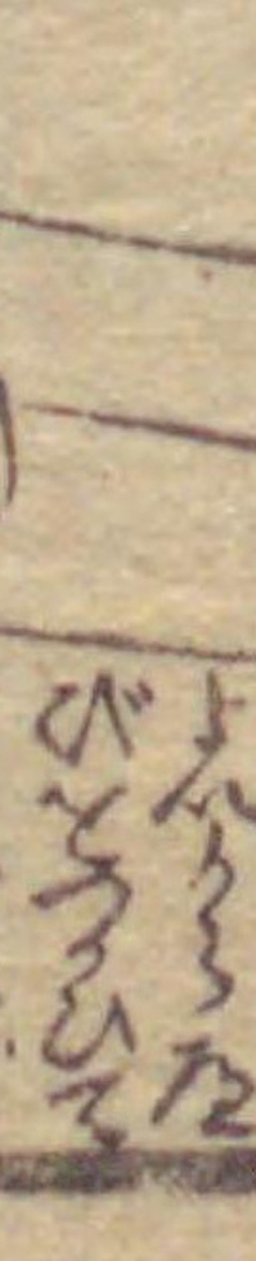びをつかひて
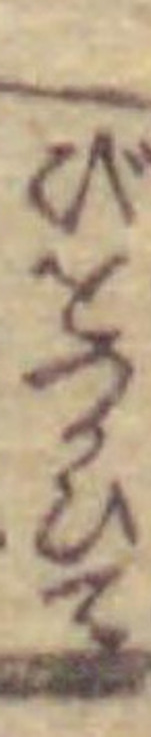びをつかひて
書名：御誂染長寿小紋 : 3巻
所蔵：国立国会図書館 National Diet Library, JAPAN
